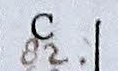82.
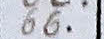66.
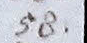58.
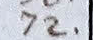72
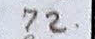72
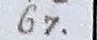67.
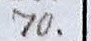70.
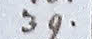39
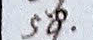58
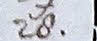28.
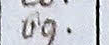69.
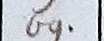69.
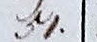51.
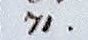71
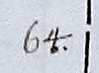64.
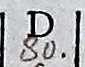80
